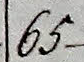65
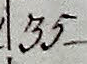35
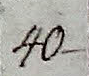40
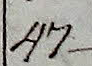47
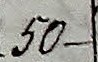50
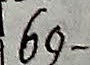69
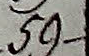59
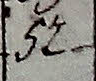52
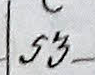53
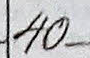40
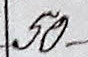50
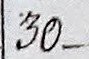30
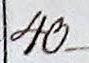40
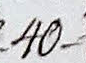40
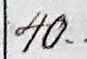40
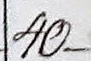40
